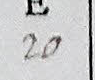20
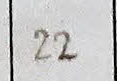22
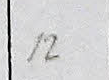12
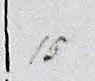15
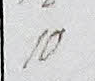10
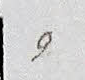9
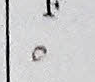0
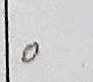0
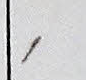1
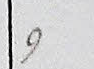9
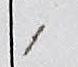1
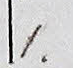1.
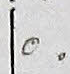0
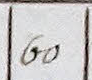60
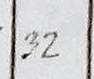32
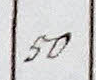50
